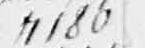7180
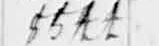5544
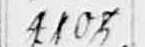4105
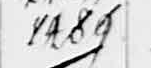1489
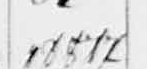13577
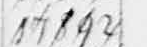17892
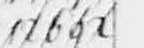17692
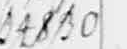4830
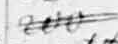200
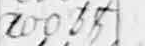20035
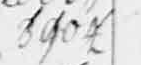3909
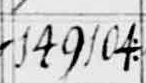149104:
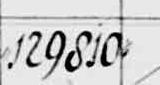129810
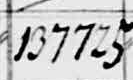137725
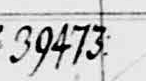39473:
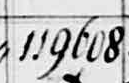119608
